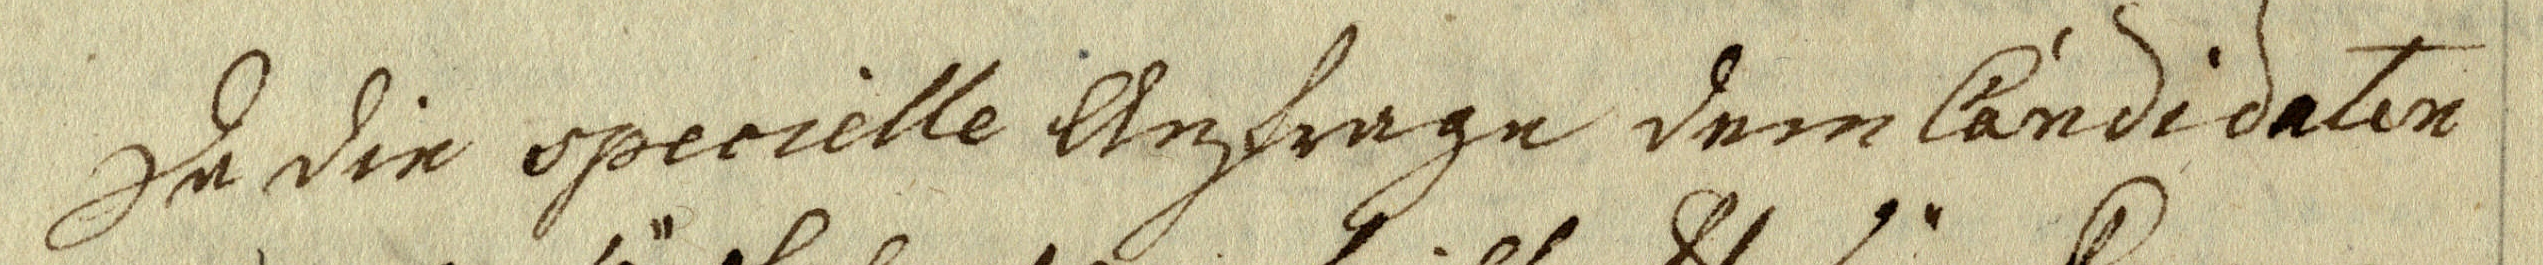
Da die specielle Anfrage dem Candidaten
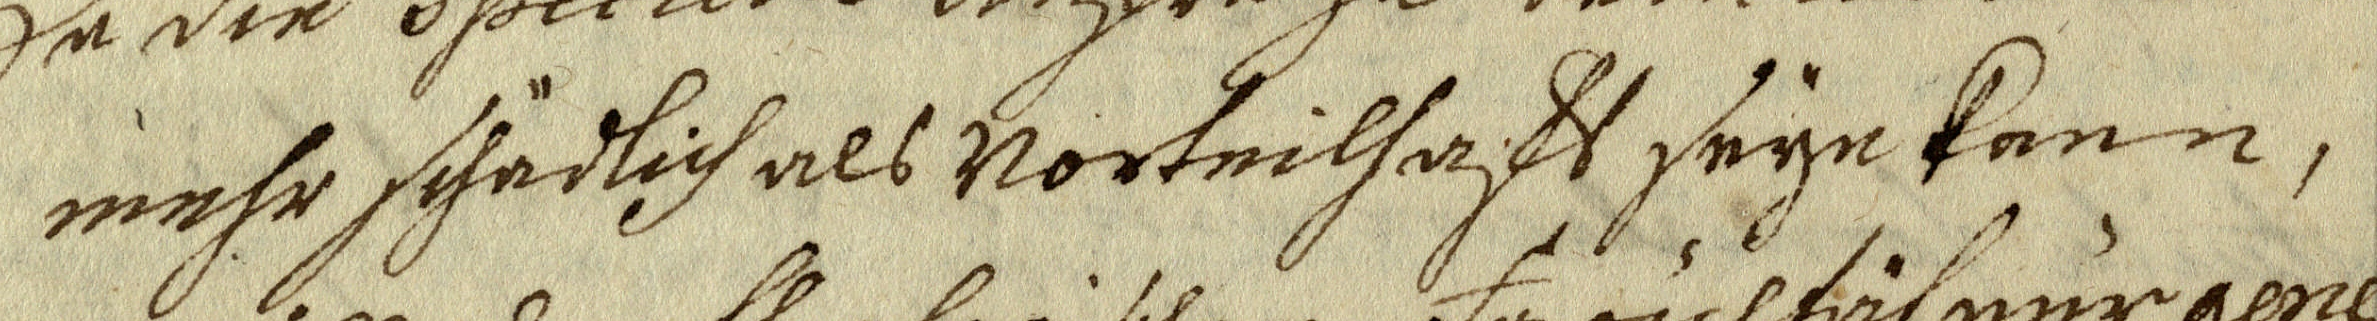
mehr schädlich als vorteilhaft seÿn kann,
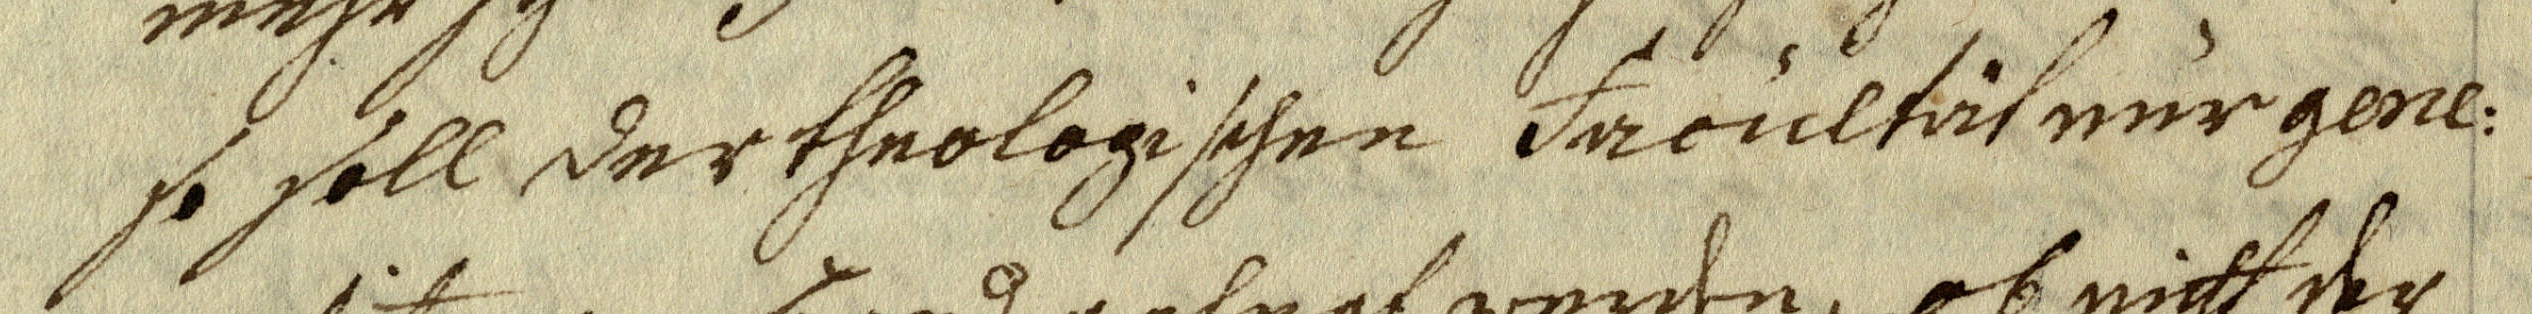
so soll der theologischen Facultät nur gene¬
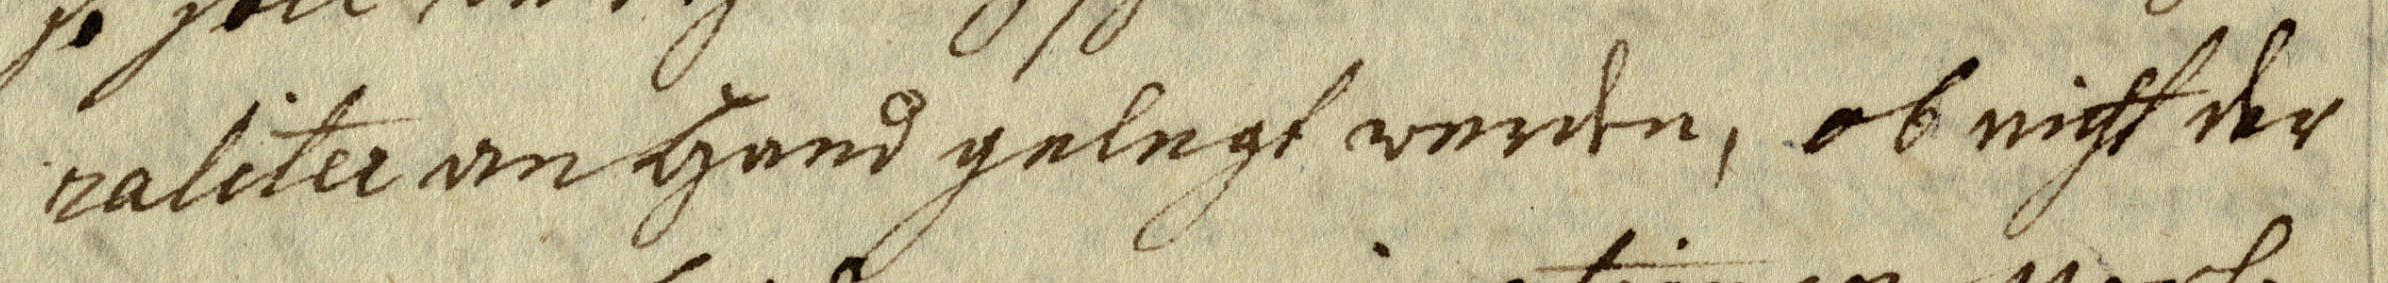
raliter an Hand gelegt werden, ob nicht der
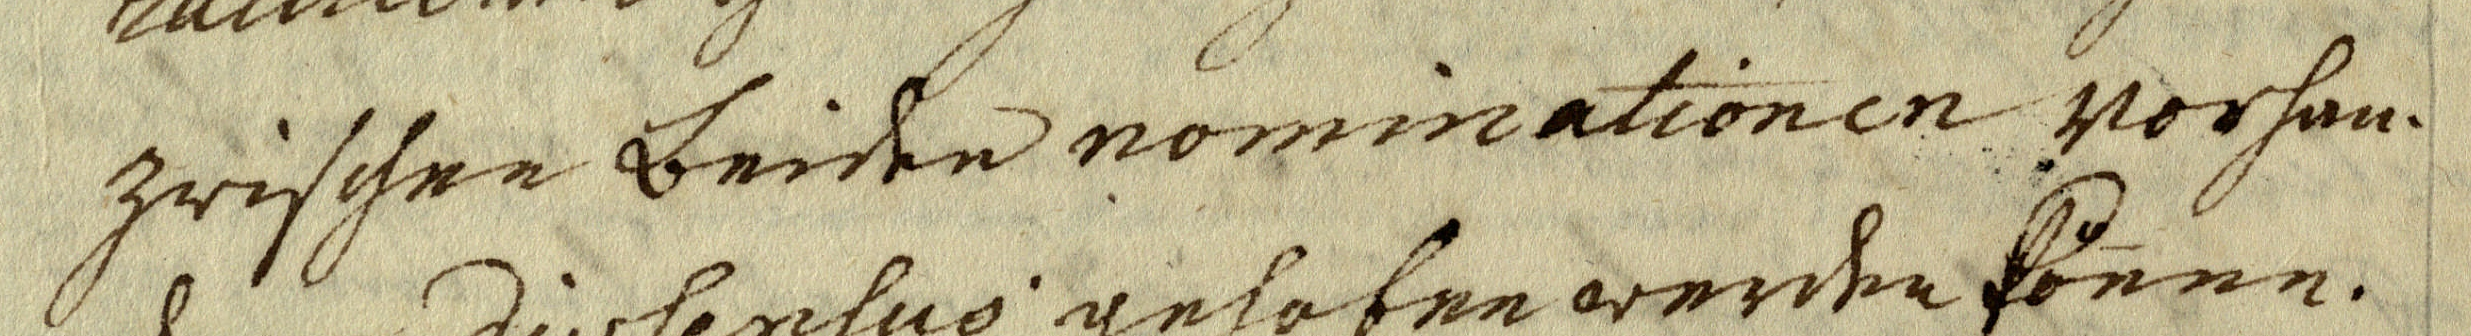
zwischen Beiden nominationen vorhan¬
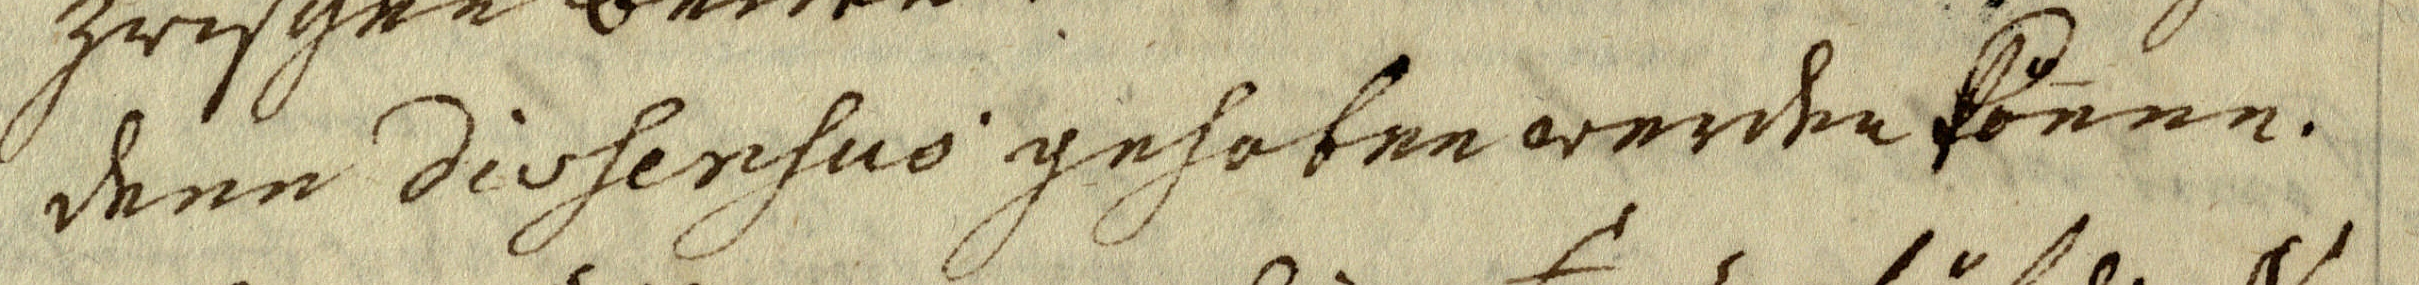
dene dissensus gehoben werden könne.
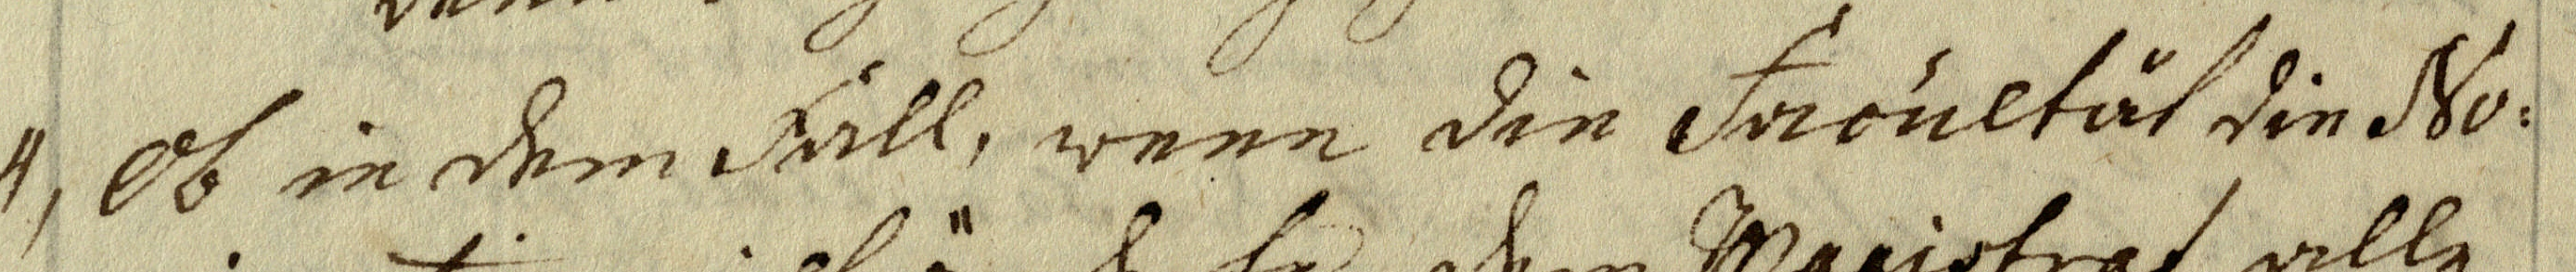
4, Ob in dem Fall, wenn die Facultät die No¬
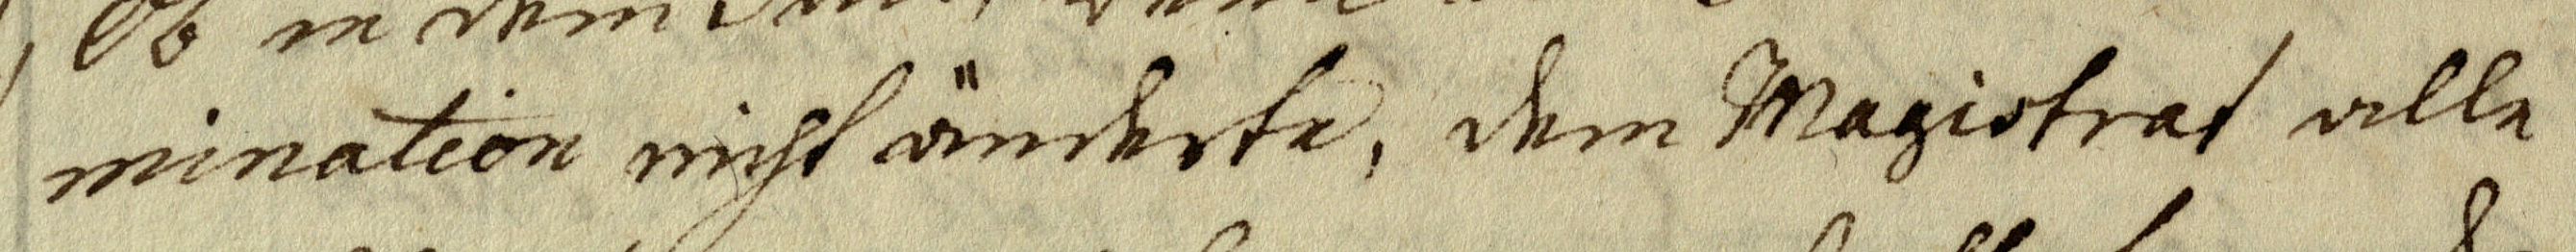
mination nicht änderte, dem Magistrat alle
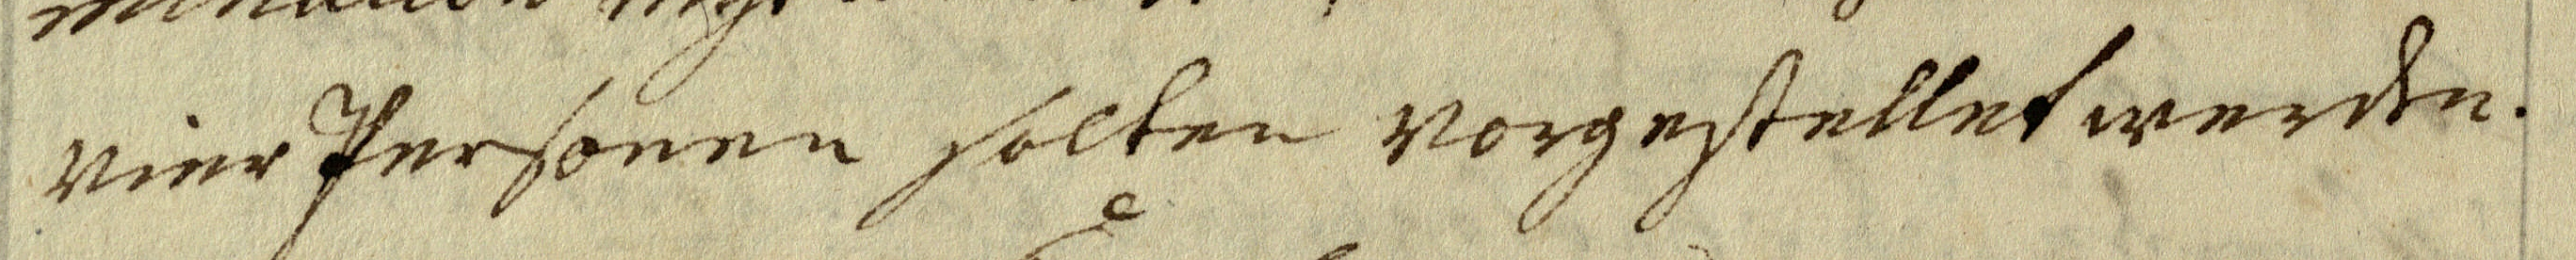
vier Personen solten vorgestellet werden.
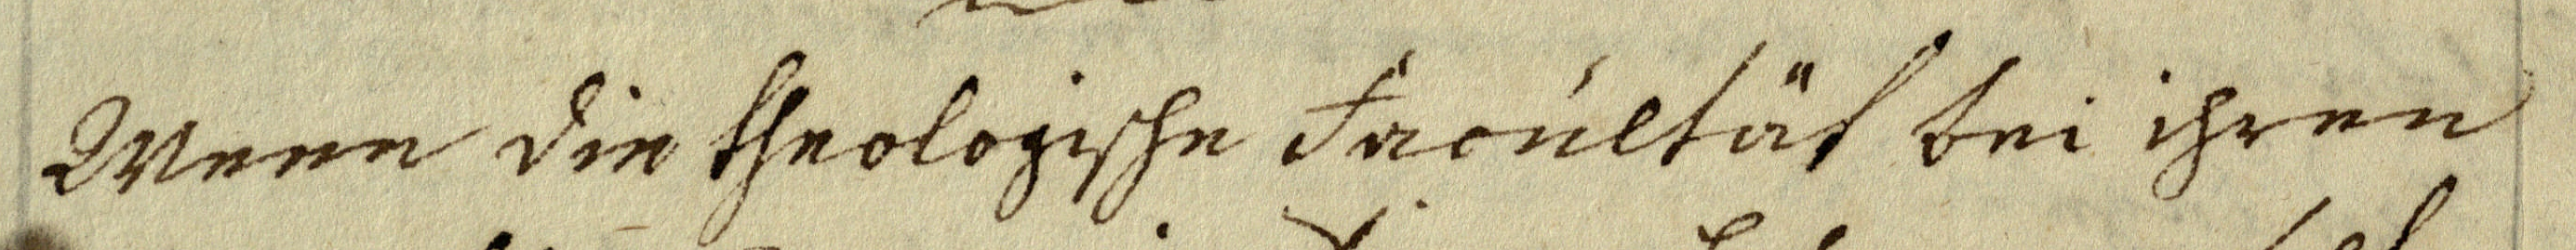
Wenn die theologische Facultät bei ihren
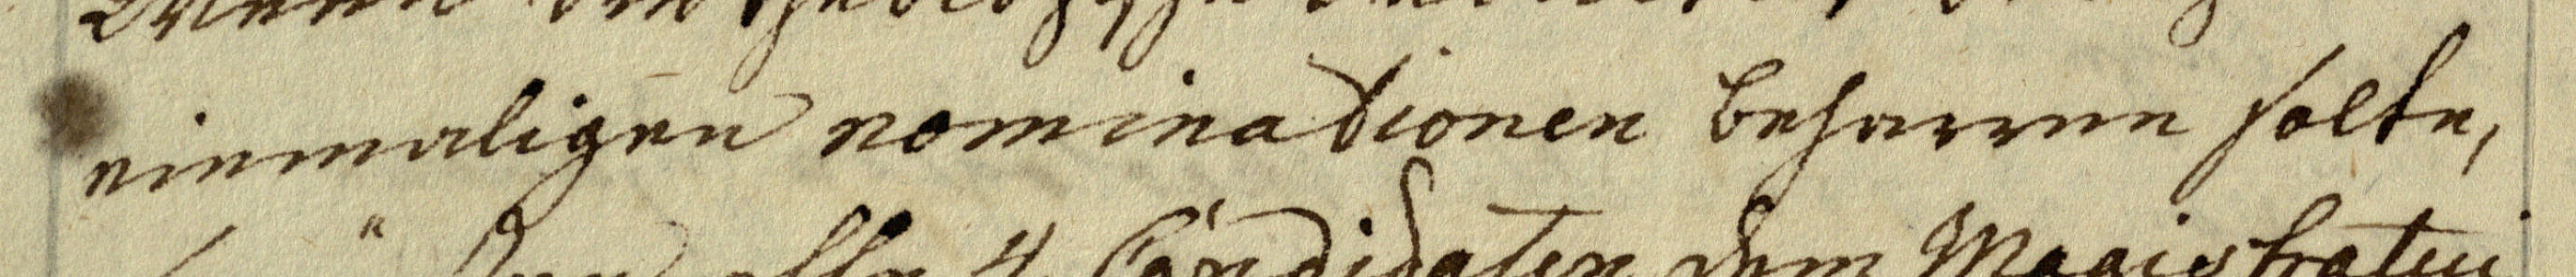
einmaligen nominationen beharren solte,
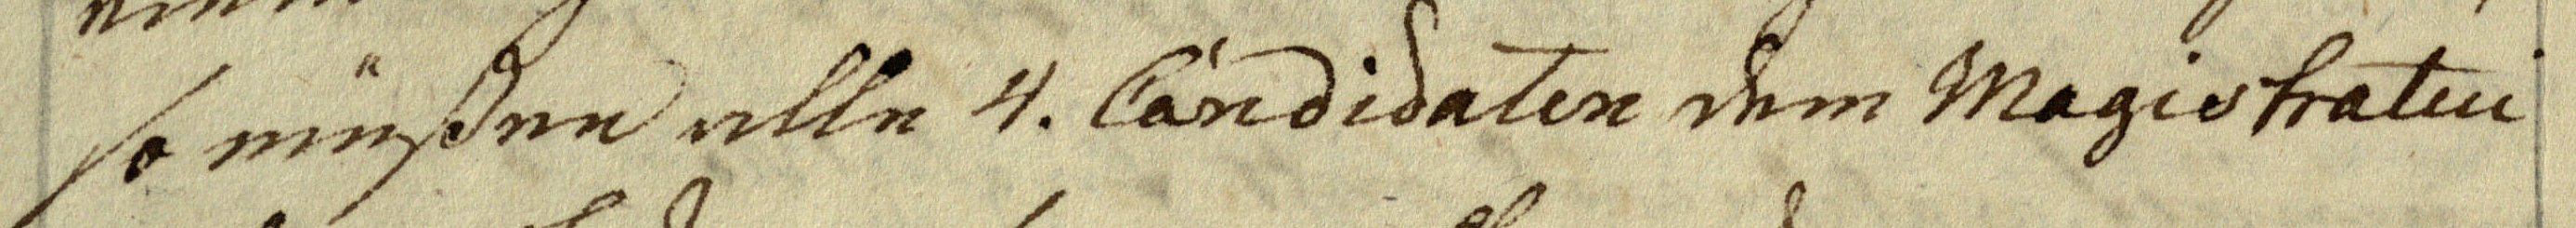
so müßen alle 4. Candidaten dem Magistratui
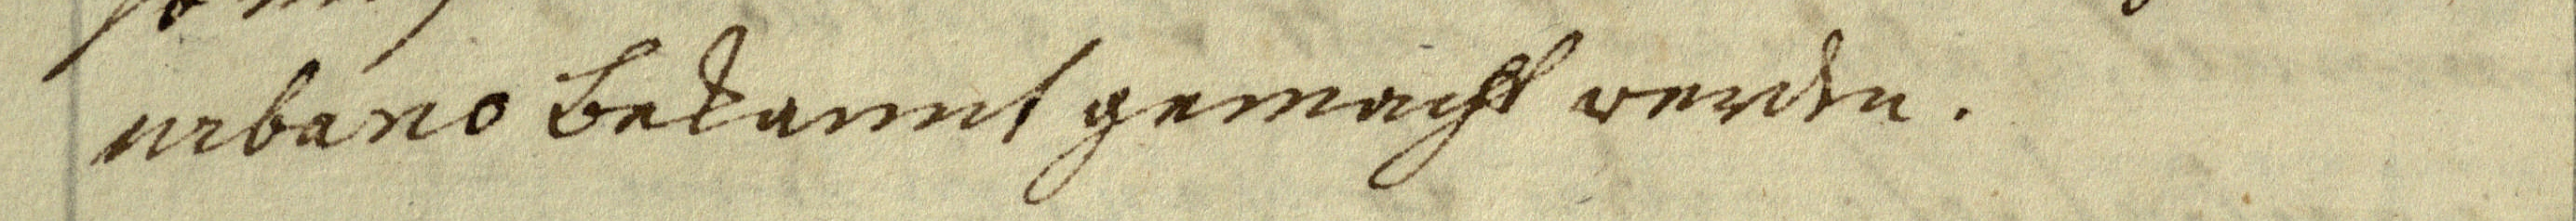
urbano bekannt gemacht werden.
